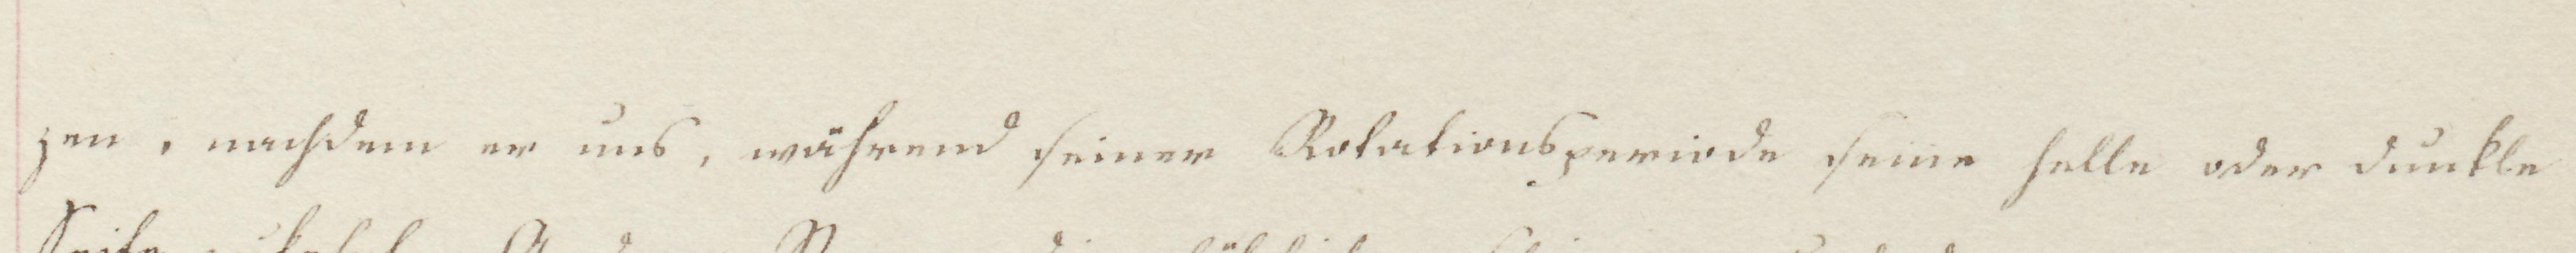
zen, nachdem er uns, während seiner Rotationsperiode seine helle oder dunkle
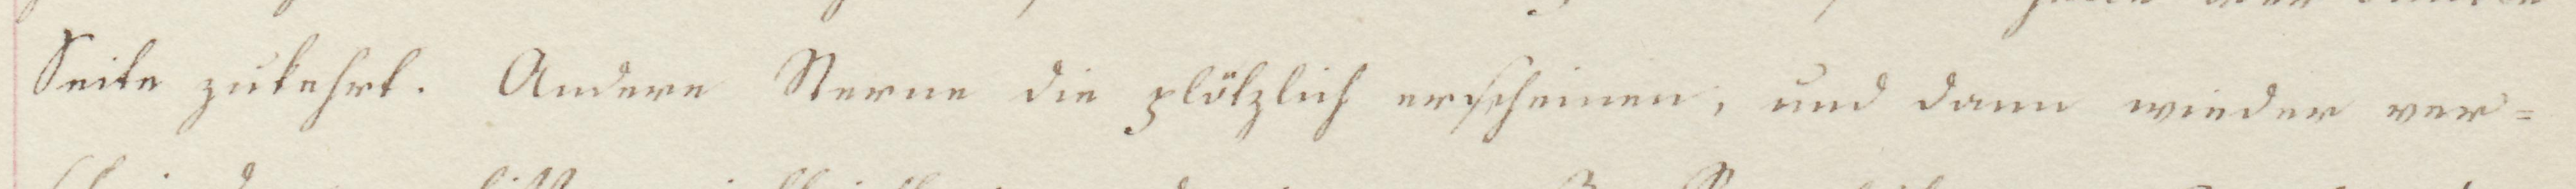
Seite zukehrt. Andere Sterne die plötzlich erscheinen, und dann wieder ver-
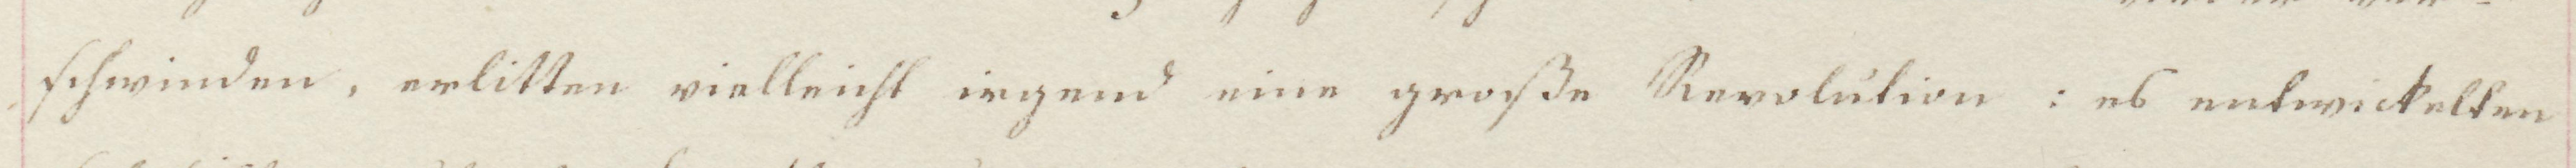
schwinden, erlitten vielleicht irgend eine große Revolution: es entwickelten
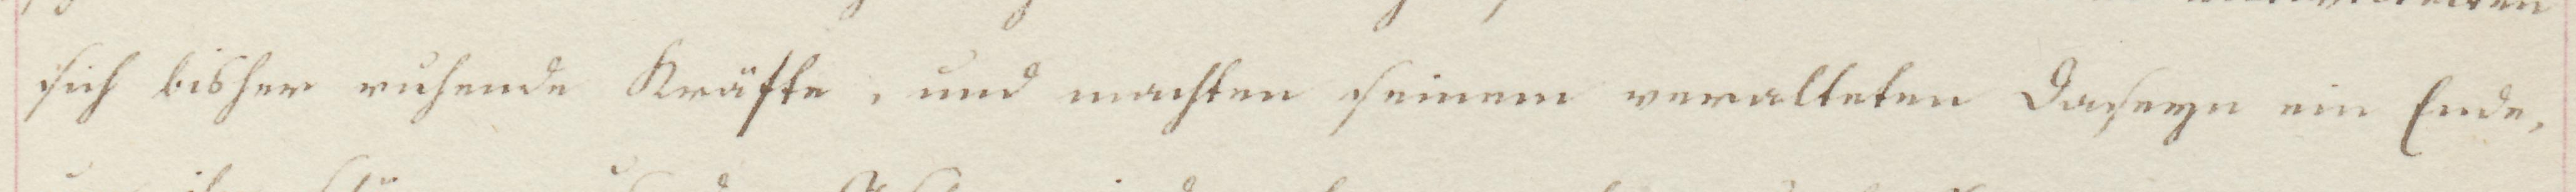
sich bisher ruhende Kräfte, und machten seinem veralteten Daseyn ein Ende,
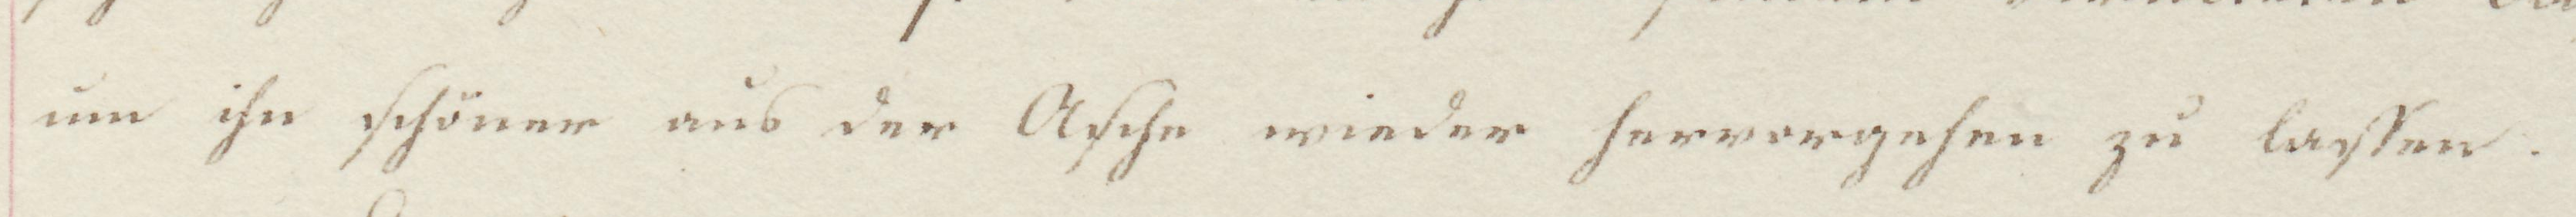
um ihn schöner aus der Asche wieder hervorgehen zu lassen.
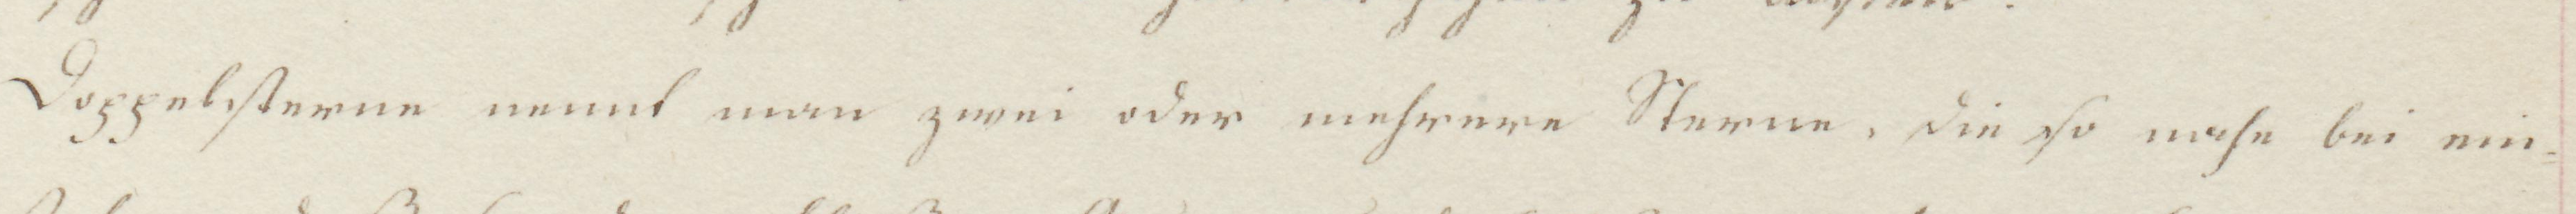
Doppelsterne nennt man zwei oder mehrere Sterne, die so nahe bei ein-
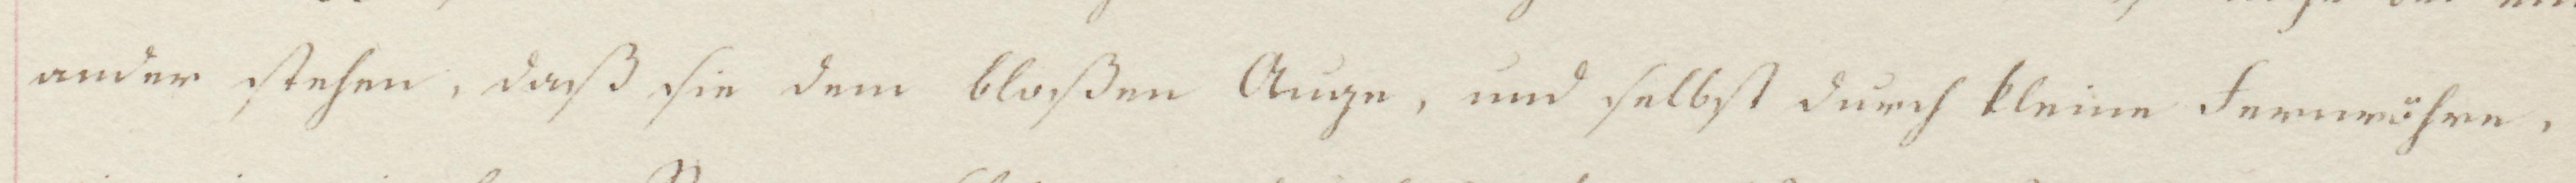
ander stehen, daß sie dem bloßen Auge, und selbst durch kleine Fernröhre,
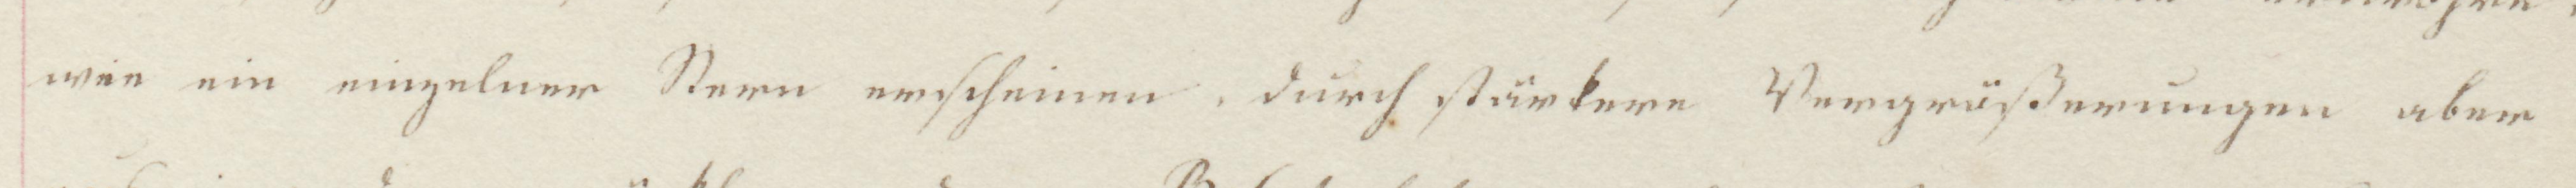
wie ein einzelner Stern erscheinen, durch stärkere Vergrößerungen aber
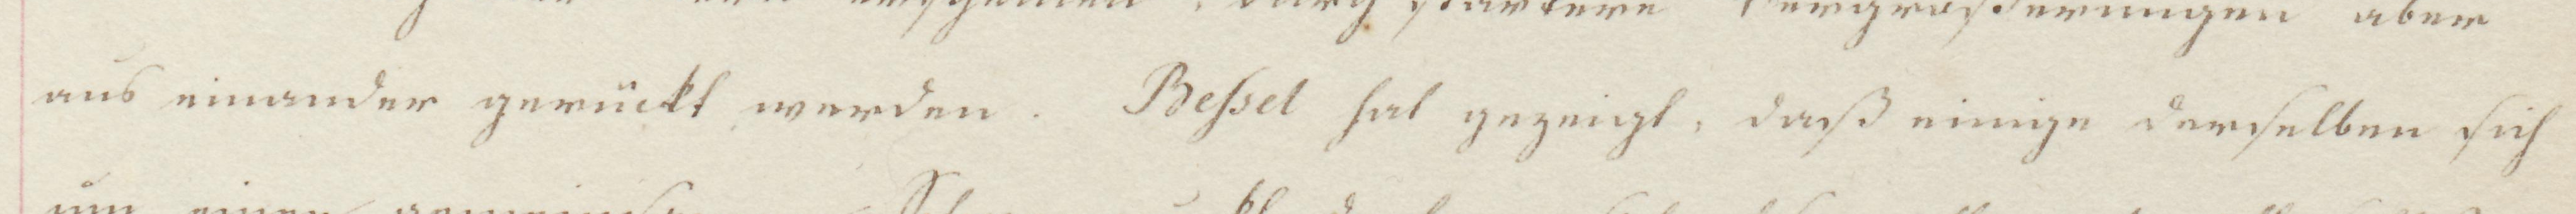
aus einander gerückt werden. Bessel hat gezeigt, daß einige derselben sich
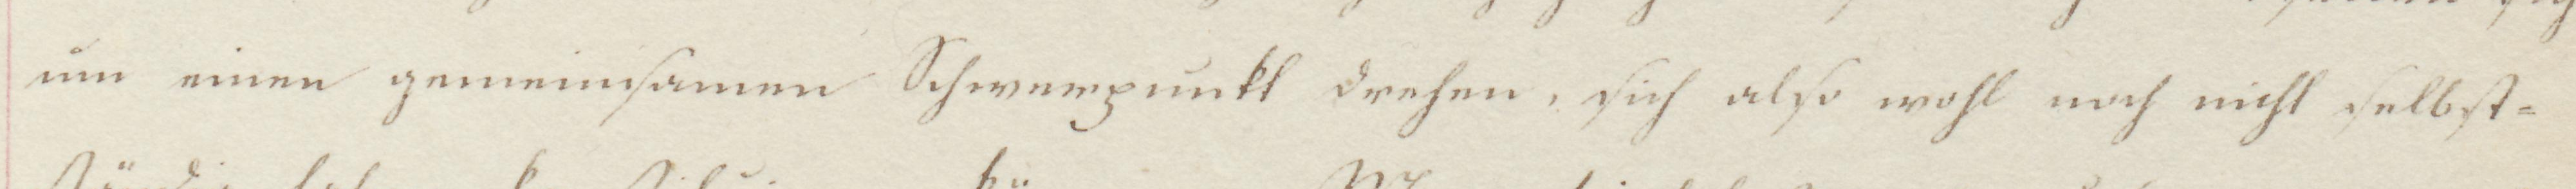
um einen gemeinsamen Schwerpunkt drehen, sich also wohl noch nicht selbst-
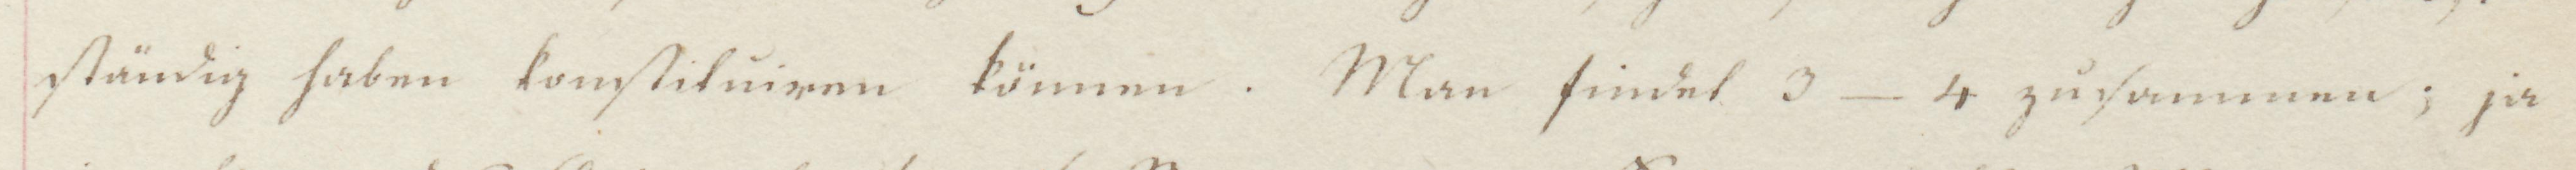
ständig haben konstituiren können. Man findet 3–4 zusammen; ja
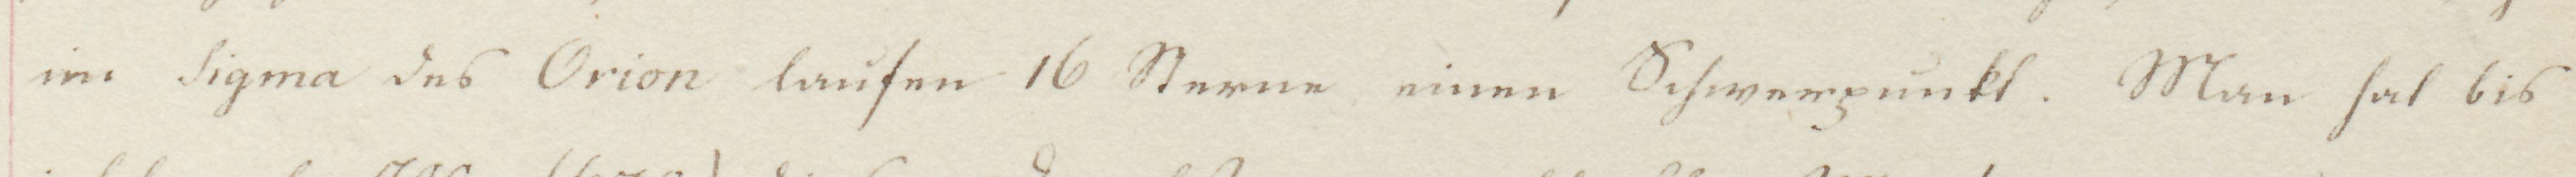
im Sigma des Orion laufen 16 Sterne einen Schwerpunkt. Man hat bis
